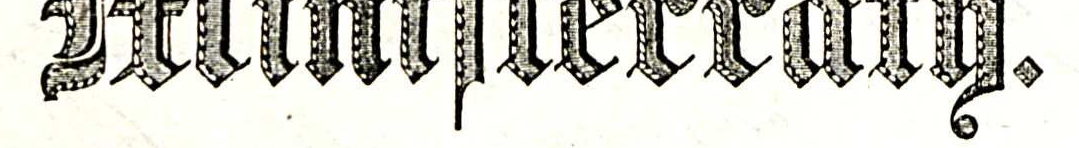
Ministerrath
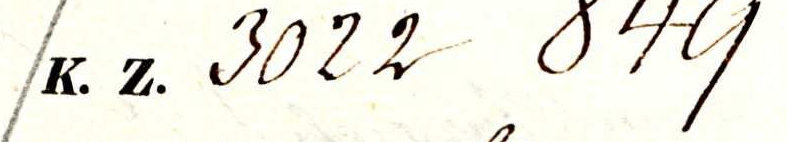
KZ 3022 849
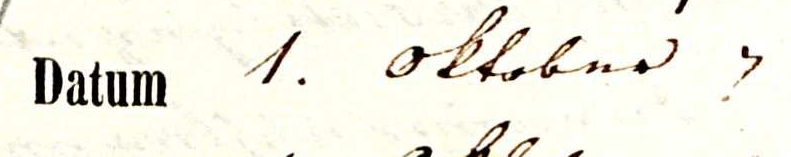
Datum 1. Oktober
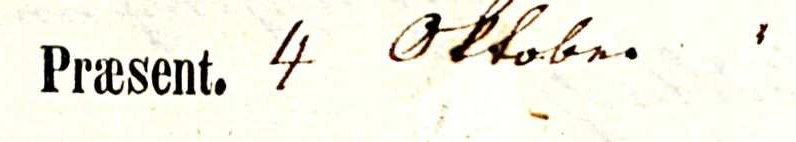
Praesent. 4 Oktober
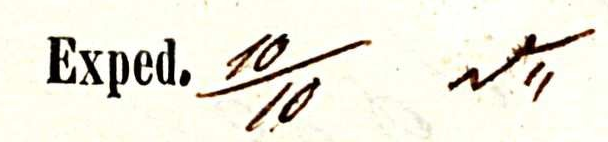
Exped. 10/10 “
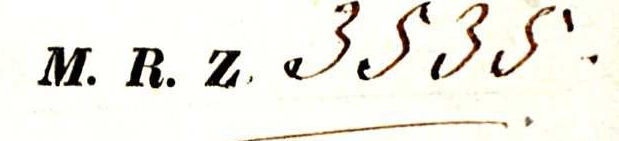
MRZ 3535
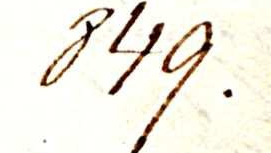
849
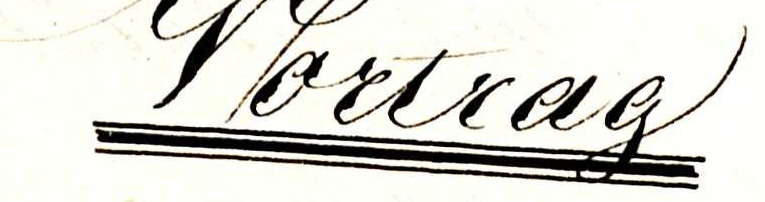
Vortrag
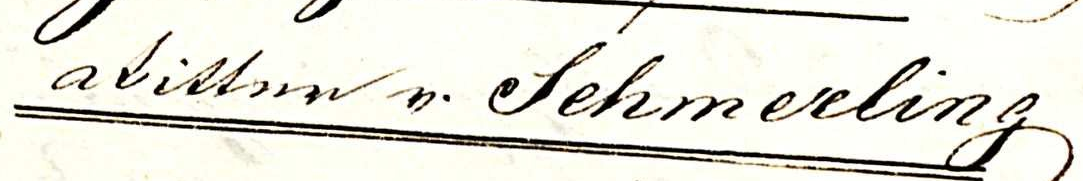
Ritter v. Schmerling
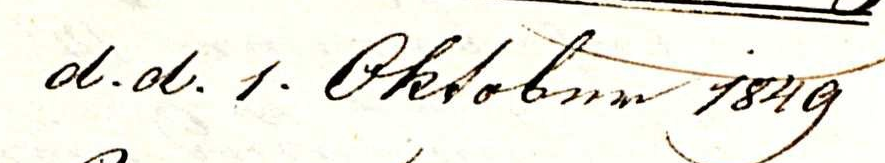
d.d. 1 Oktober 1849
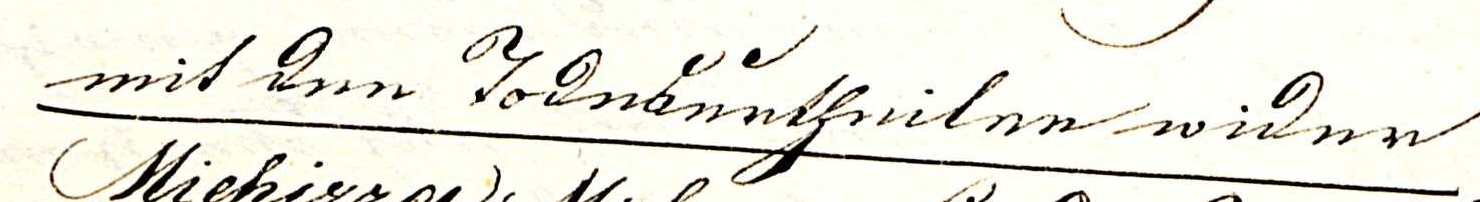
mit den Todesurtheilen wider
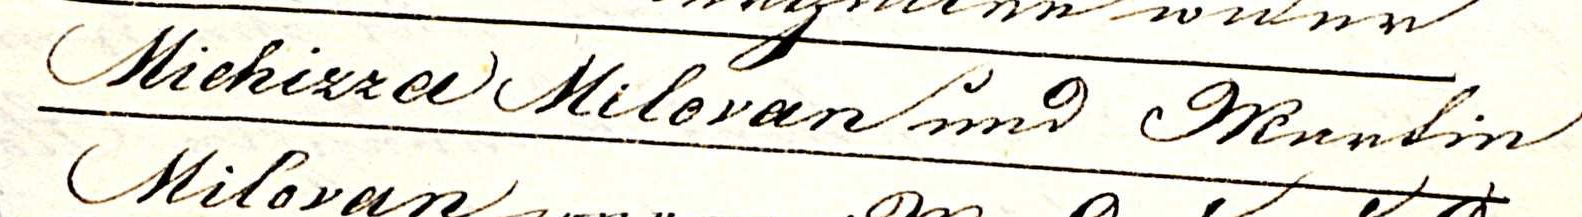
Miehizza Milovan und Martin
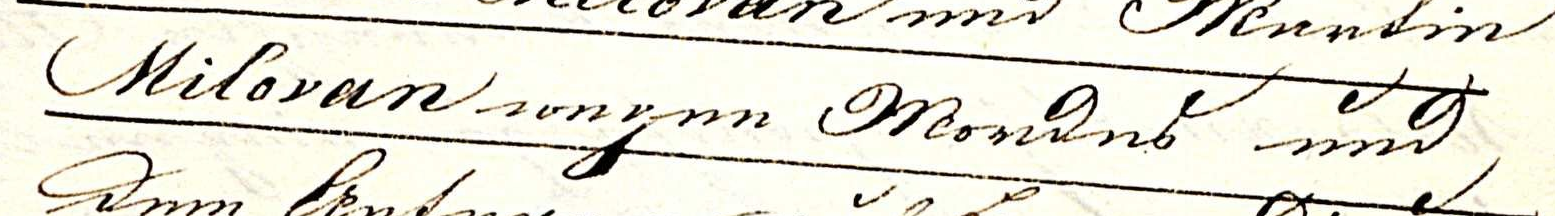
Milovan wegen Mordes und
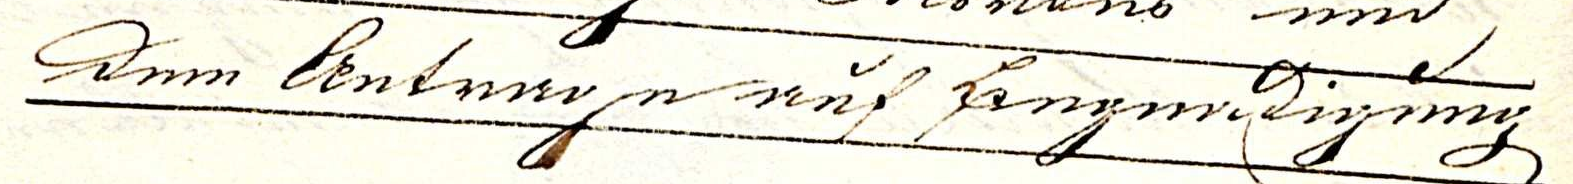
dem Antrage auf Begnadigung
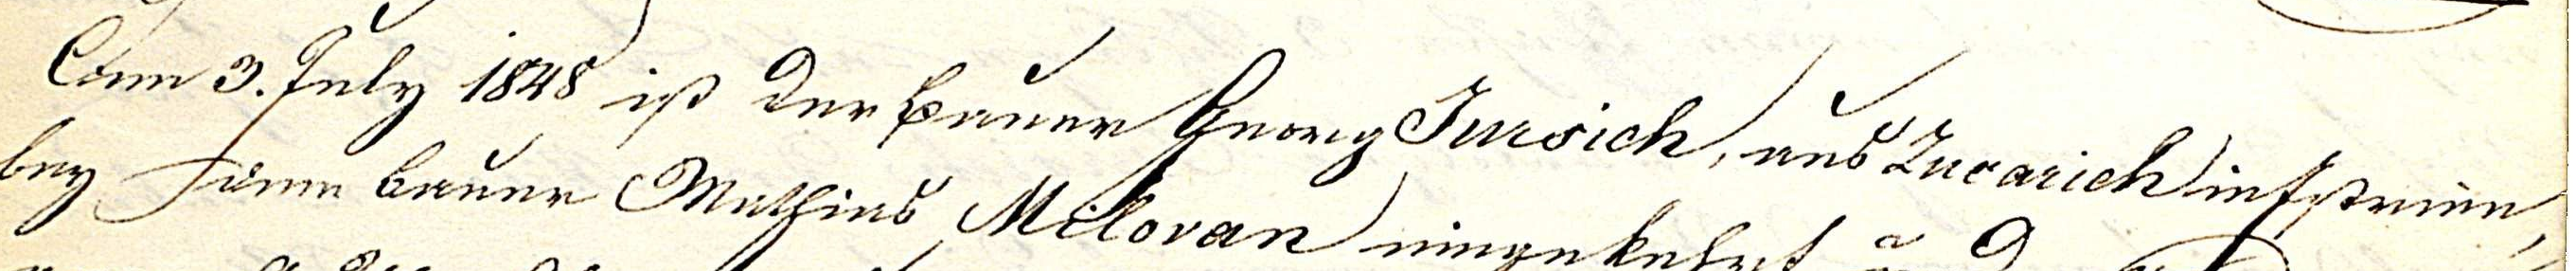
Dem 3. July 1848 ist der Bauer Georg Imsich, aus Zucarich in Istrien,
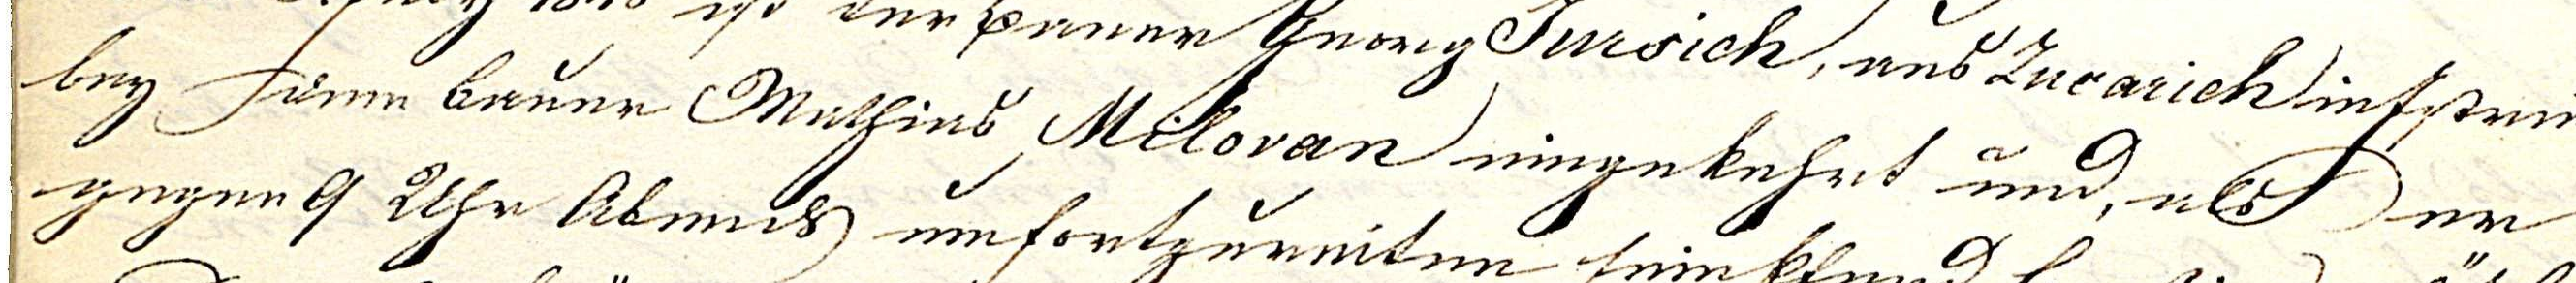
bey dem Bauer Mathias Milovan eingekehrt und, als er
